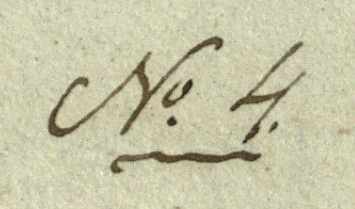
Nº 4.
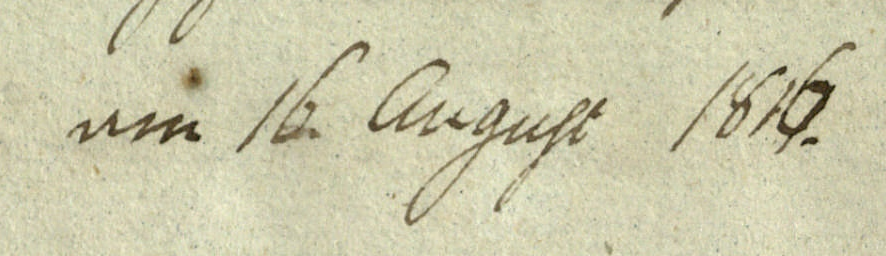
am 16. August 1816.
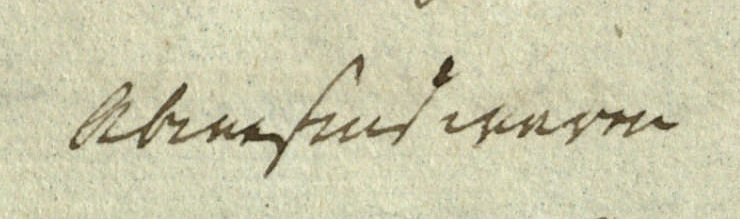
Abwesend waren
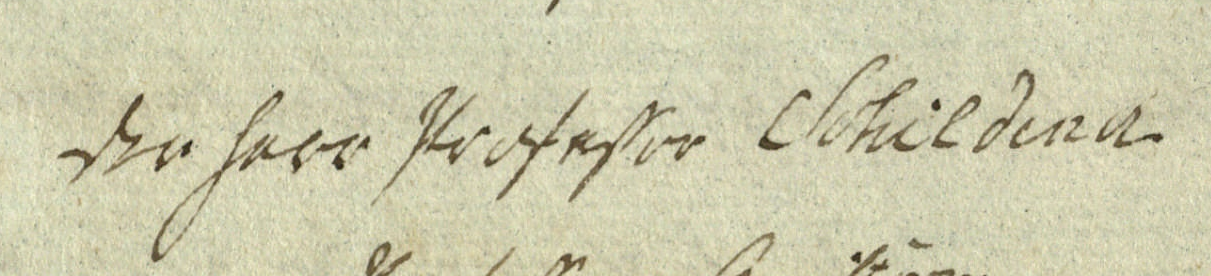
der Herr Professor Schildener.
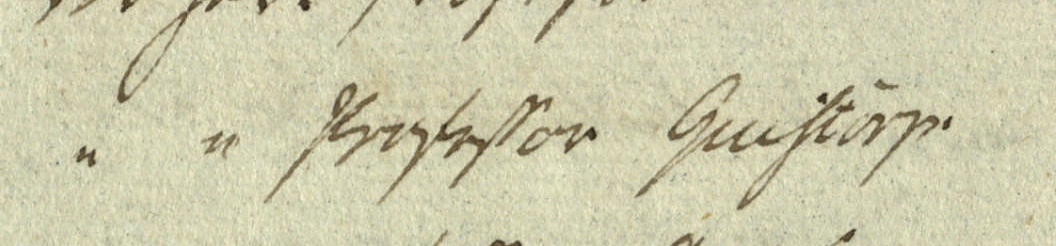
Professor Quistorp.
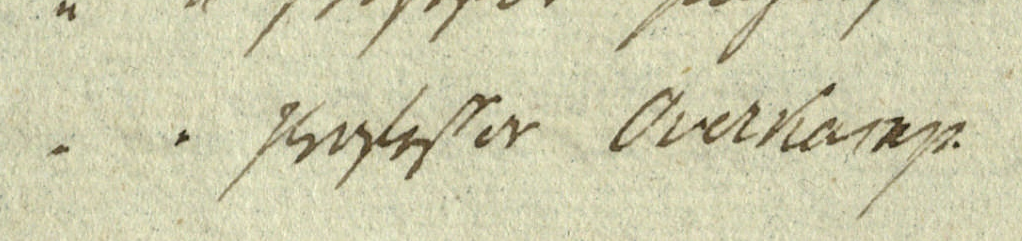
Professor Overkamp.
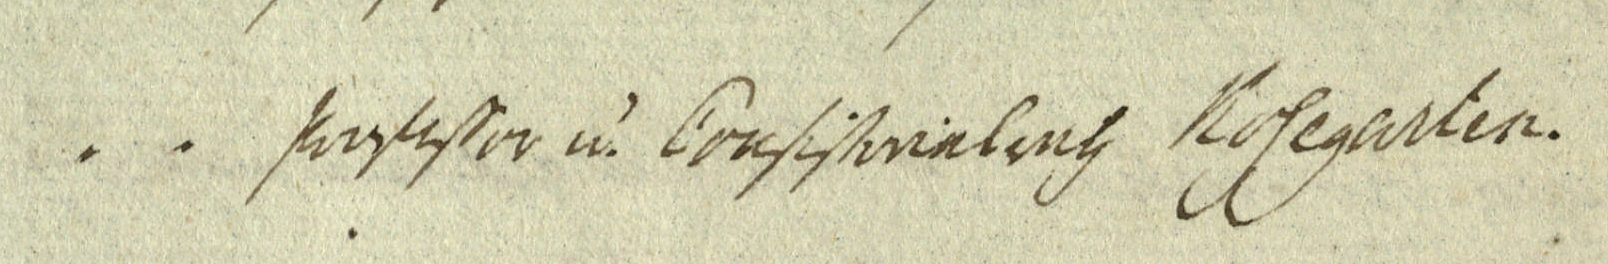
Professor u. Consistorialrath Kosegarten.
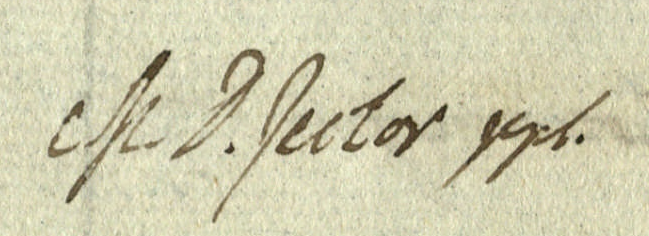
M. D. Rector ppt
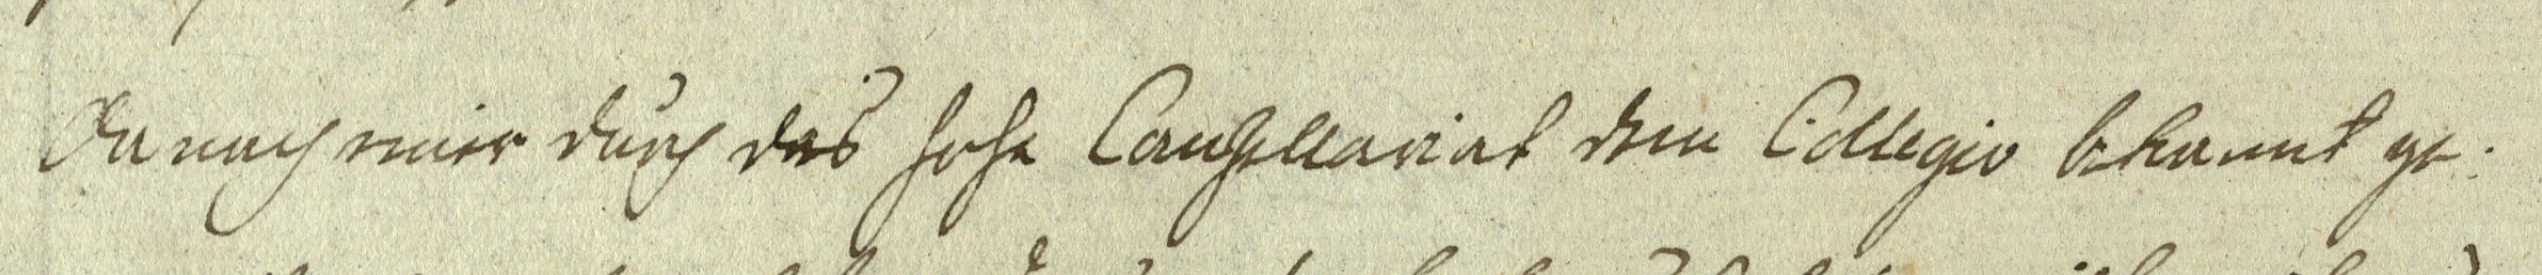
Da nach einer durch das hohe Canzellariat dem Collegio bekannt ge¬
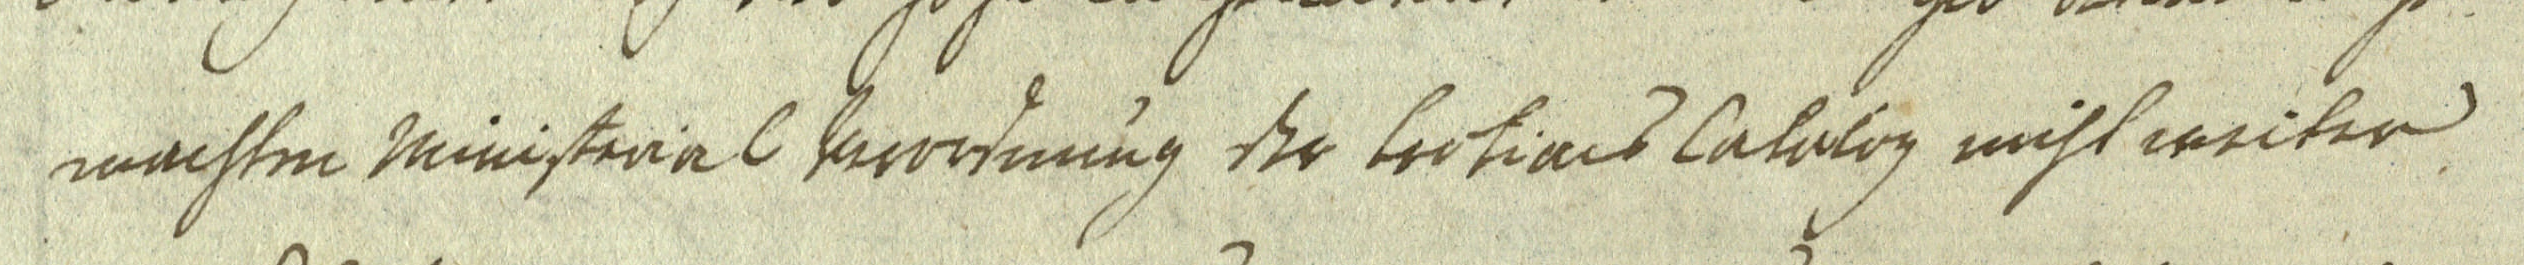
machten Ministeral Verordnung der Lections Catalog nicht weiter
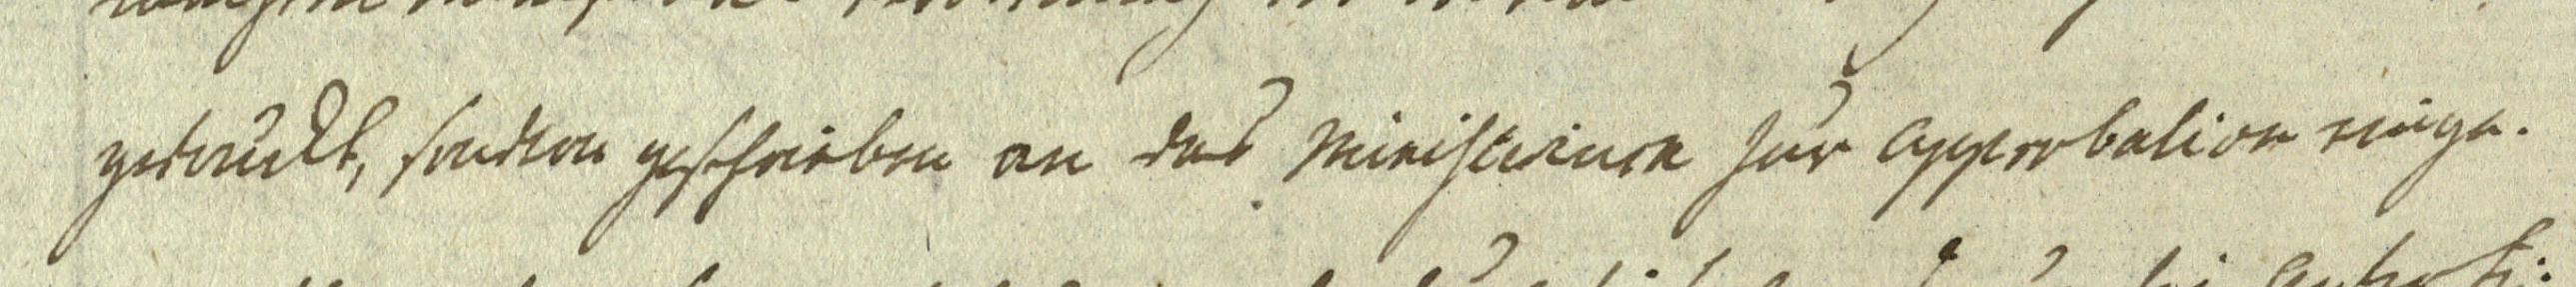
gedruckt, sondern geschrieben an das Ministerium zur Approbation einge¬
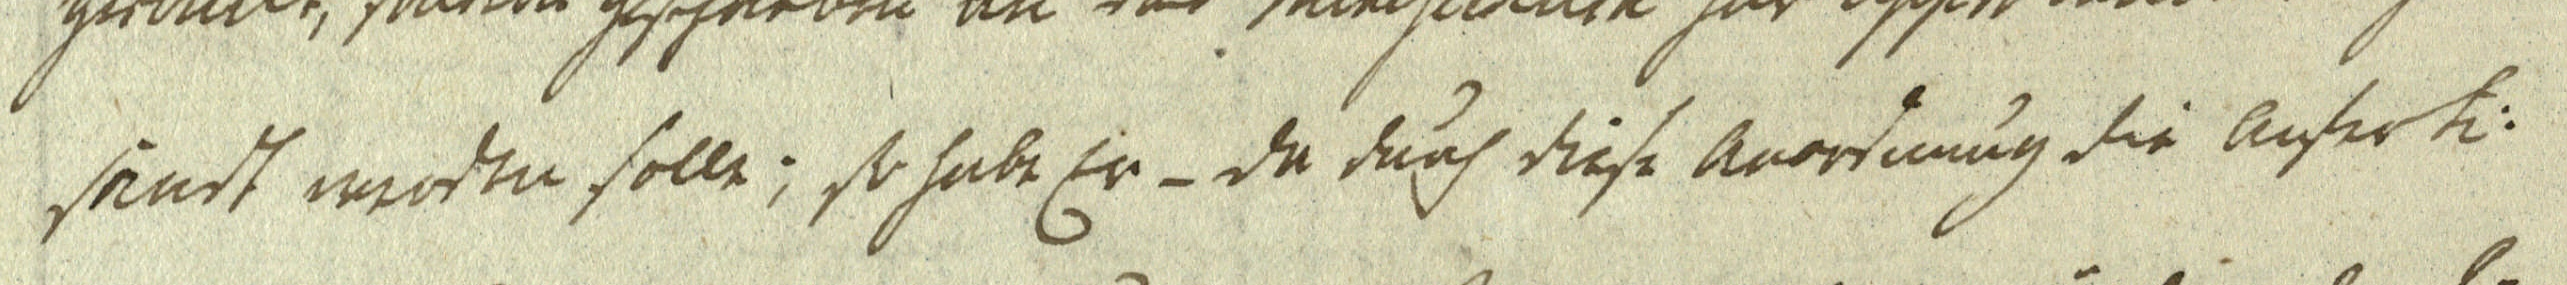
sandt werden solle; so habe Er - da durch diese Anordnung die Anferti¬
